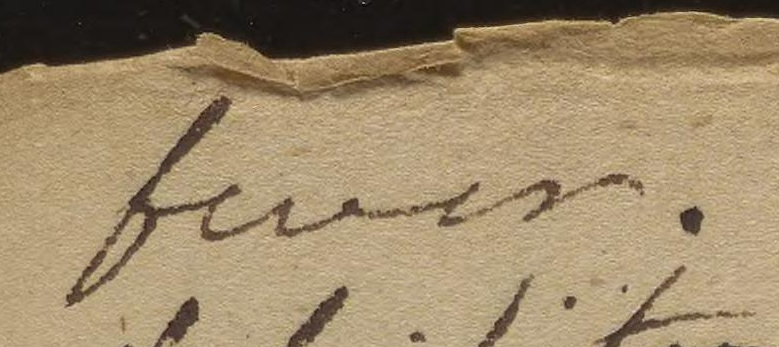fever.
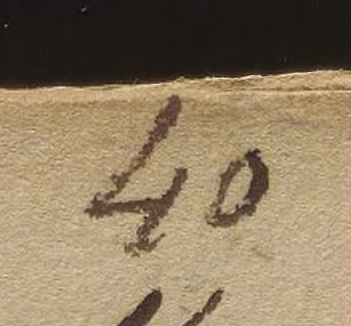40
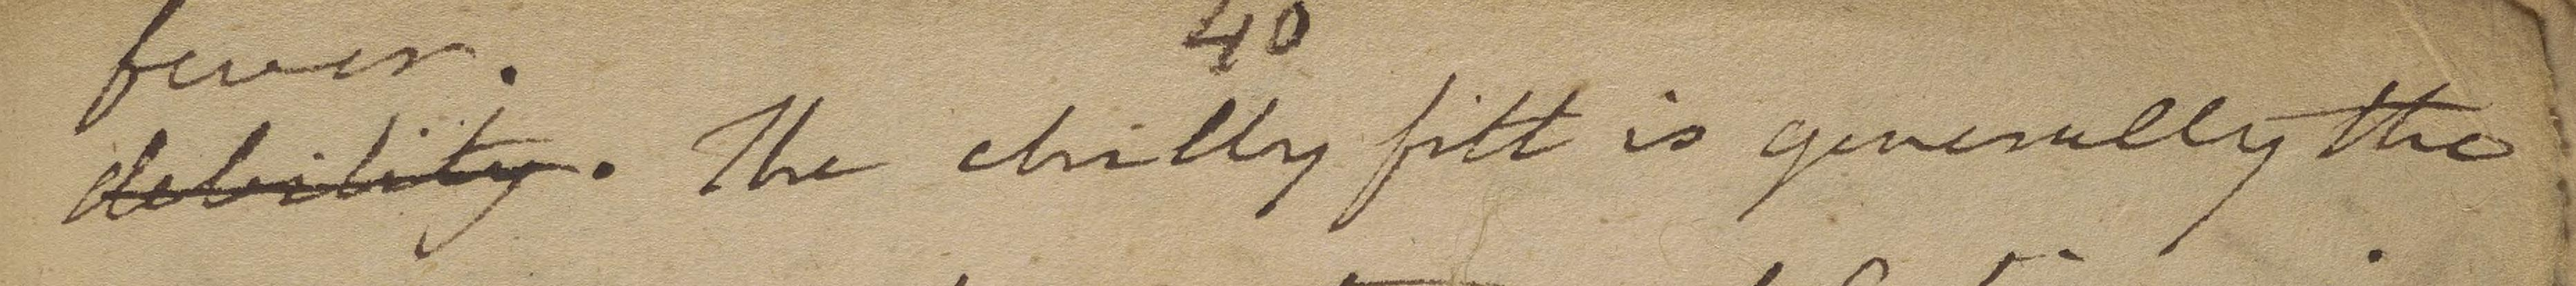[debility]. The chilly fitt is generally the
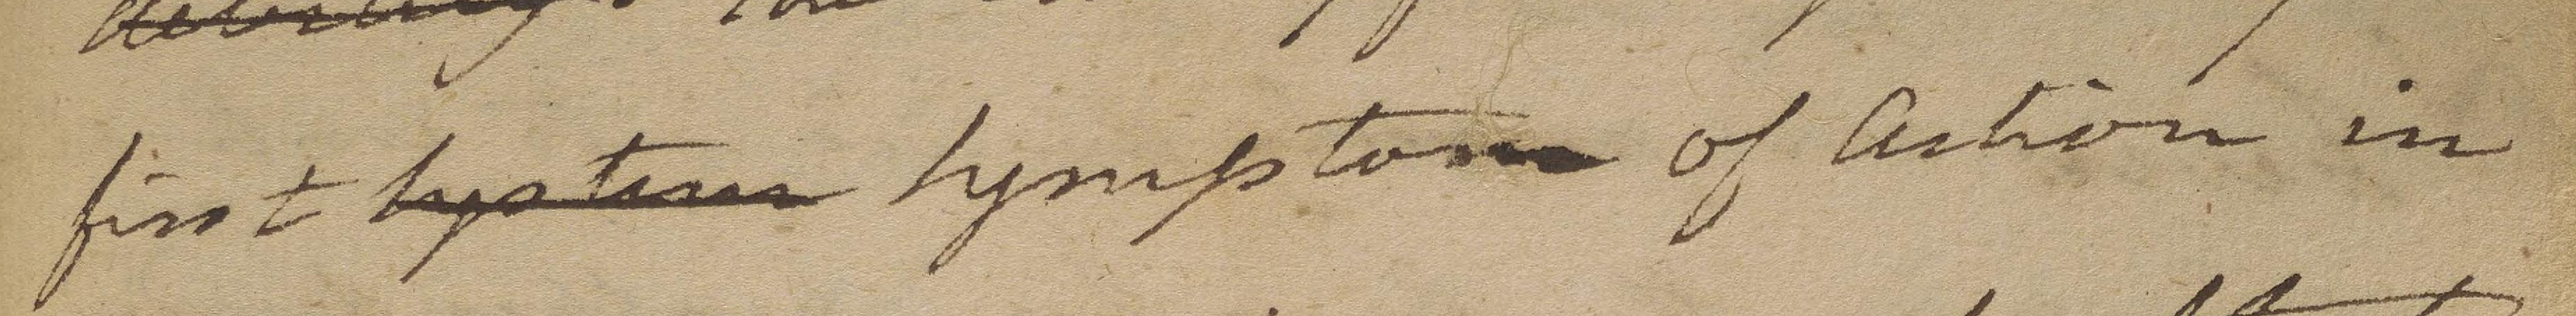first [system] symptom of action in
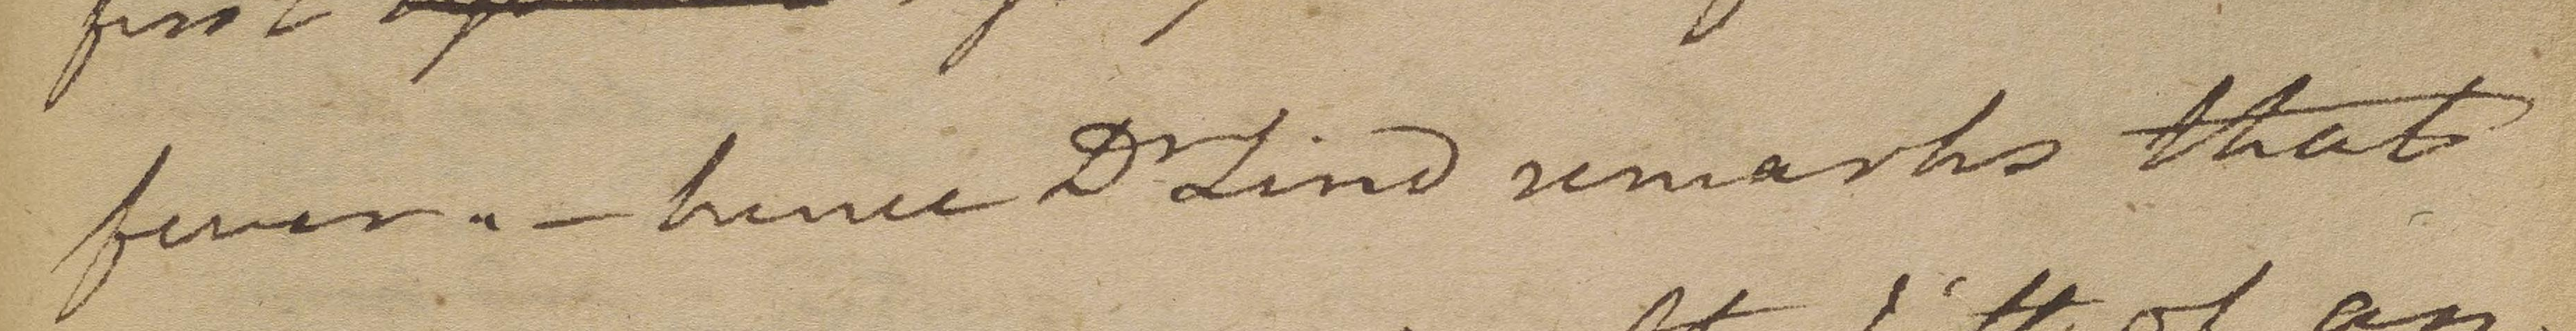fever.- hence D^r Lind remarks that
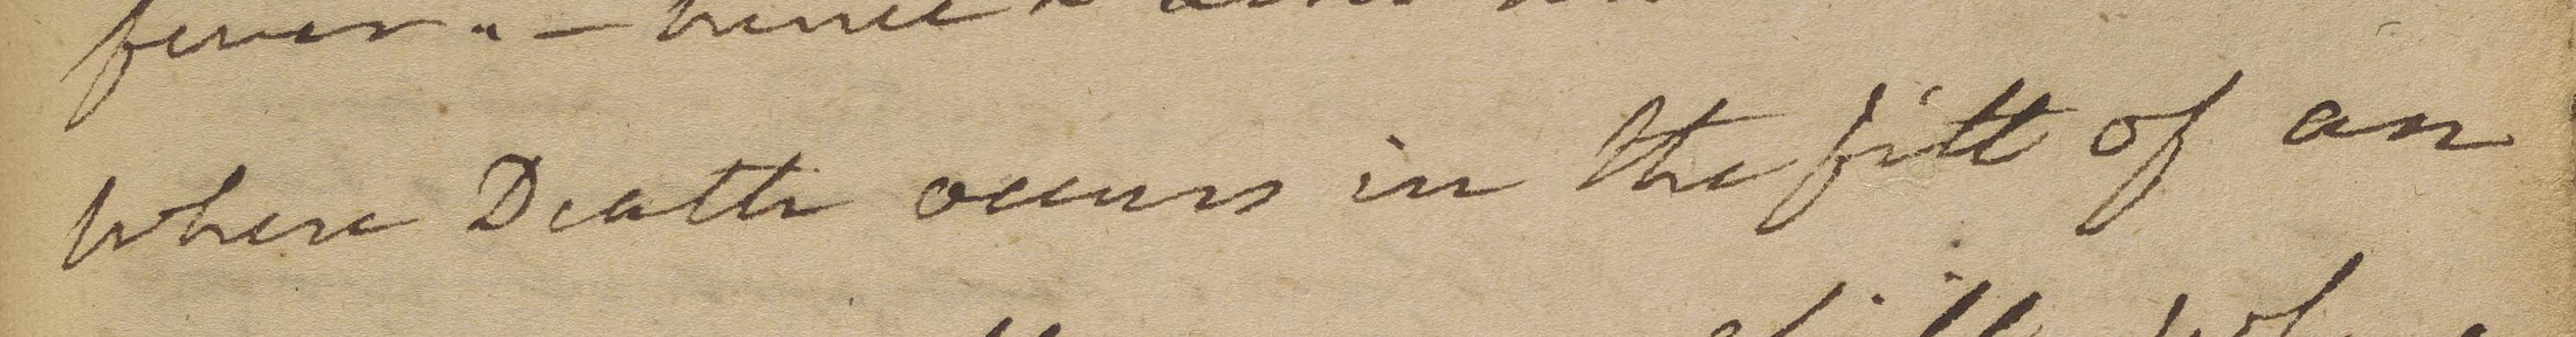where Death occurs in the fitt of an
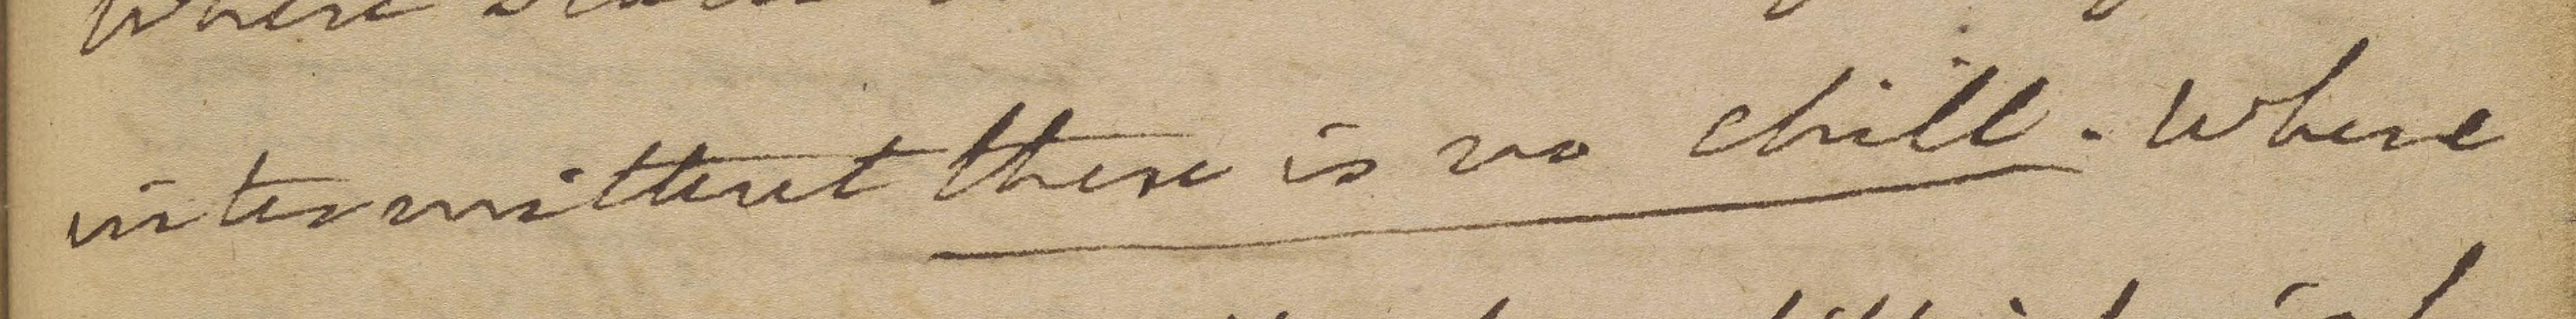intermittent there is no chill. Where
